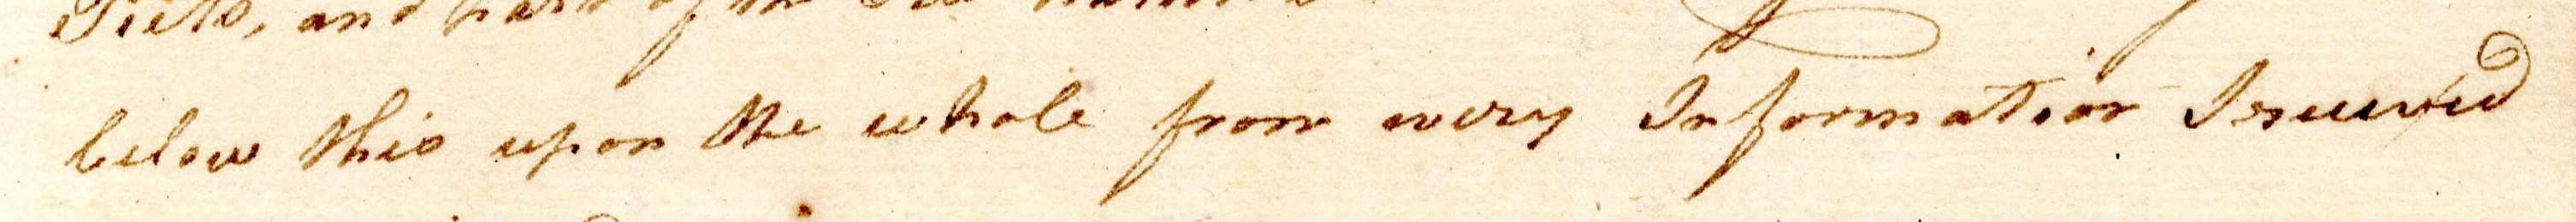below this upon the whole from every Information I received
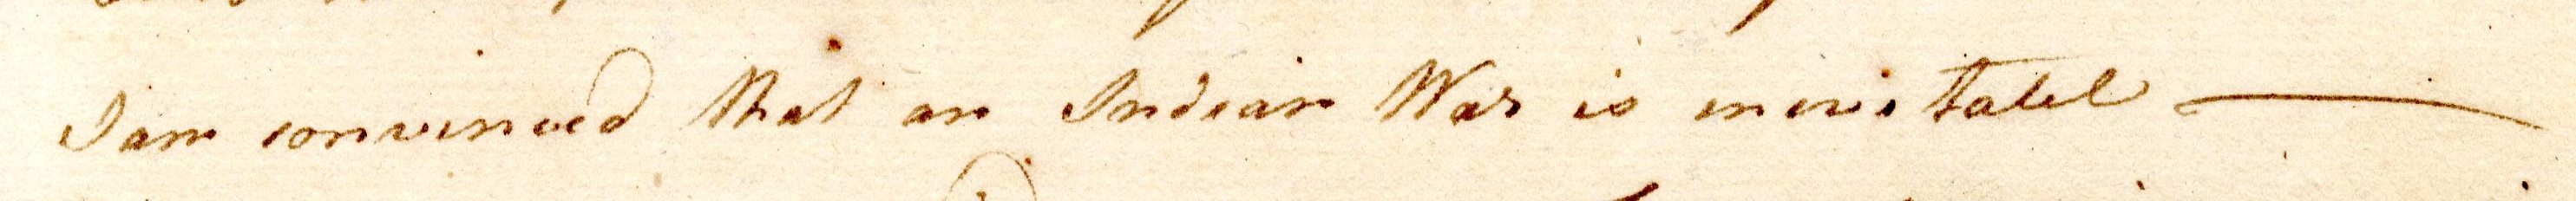I am convinced that an Indian War is inevitable-
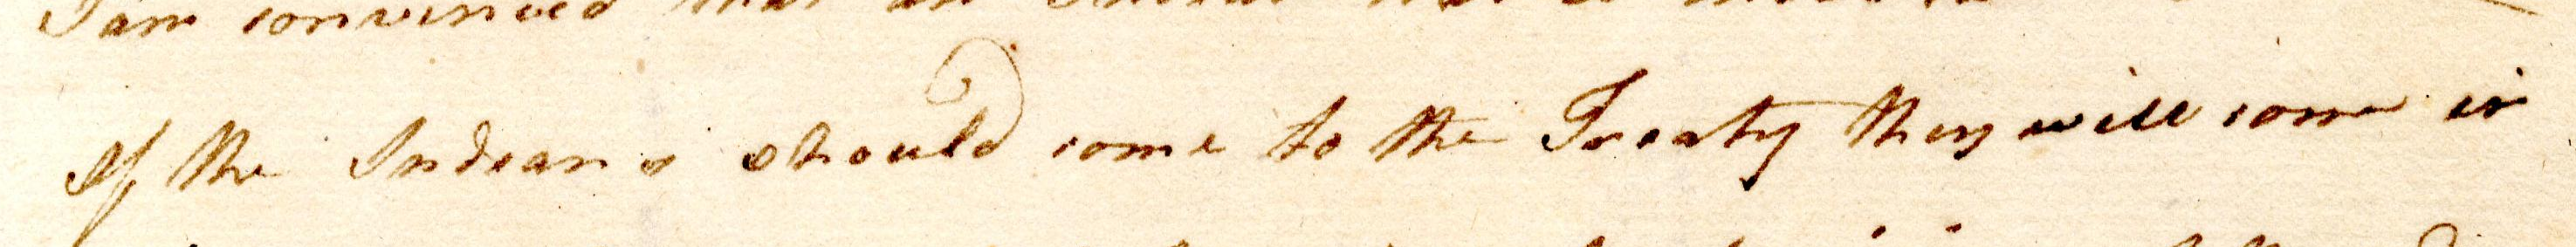If the Indians should come to the Treaty they will come in
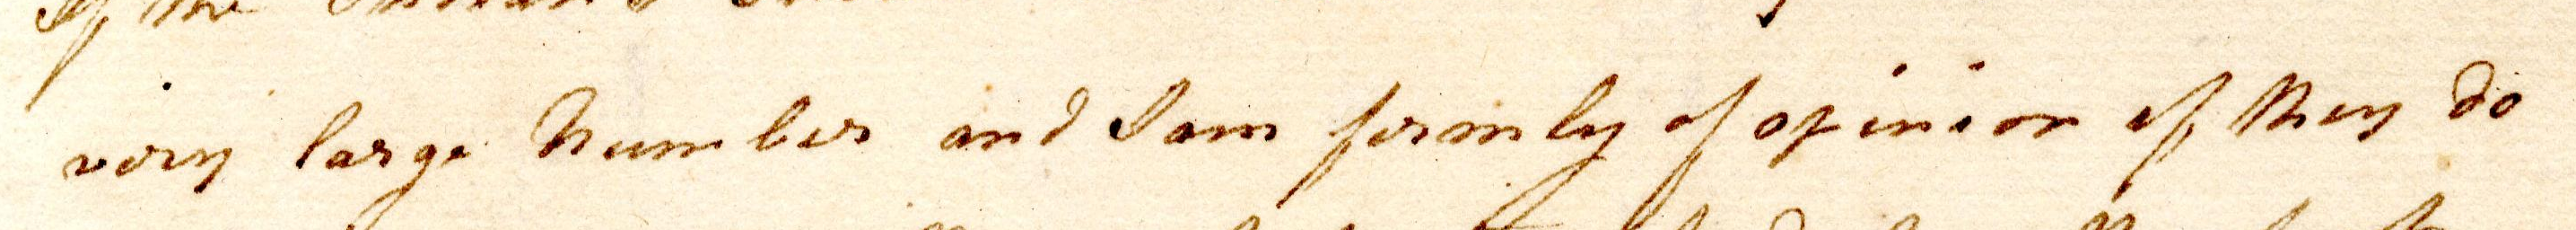very large Number and I am firmly of opinion if they do
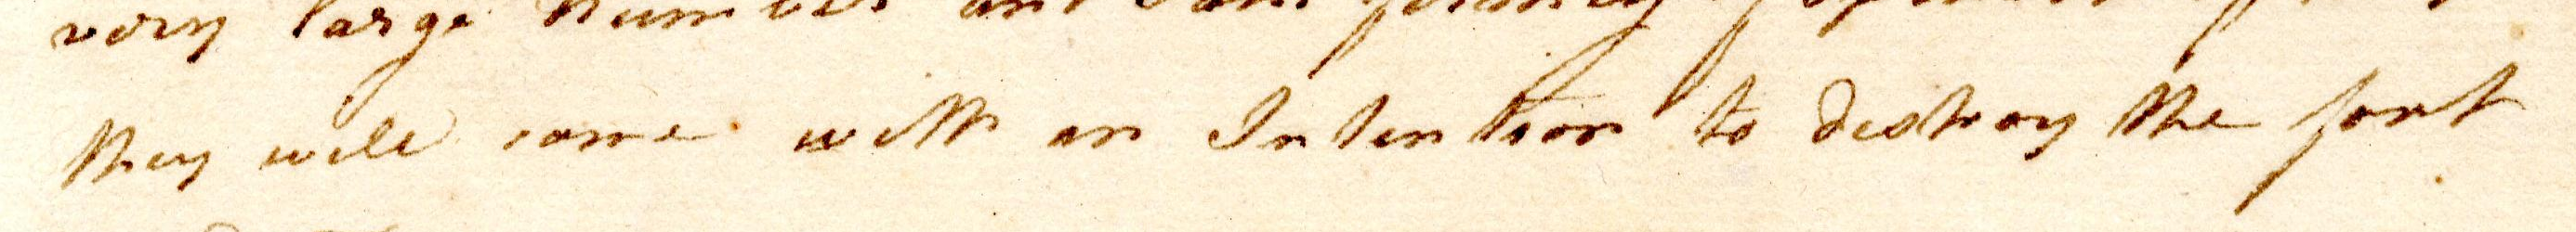they will come with an Intention to destroy the fort
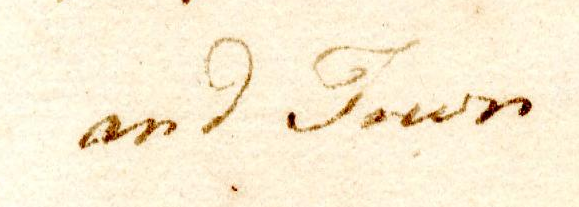and Town-
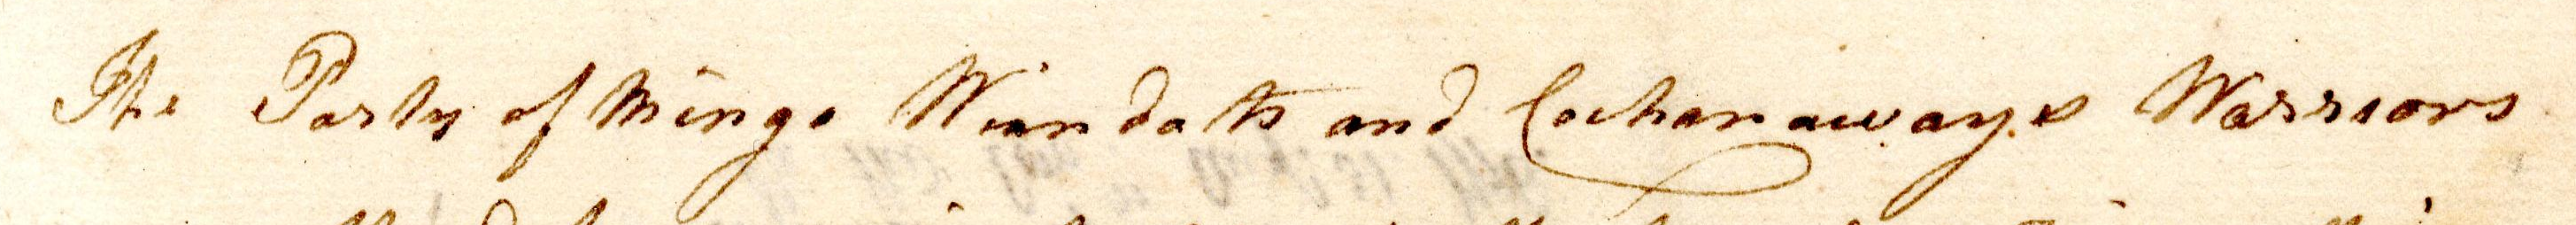The Party of Mingo Wiandats and Cochanaways Warriors
